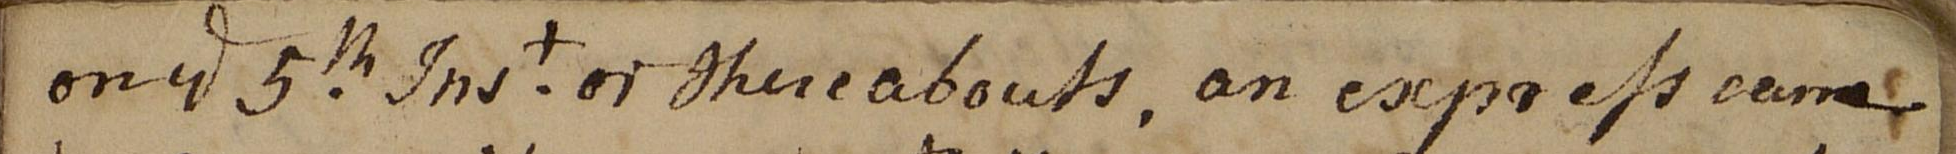on y^e 5^th. Ins^t. or thereabouts, an express came
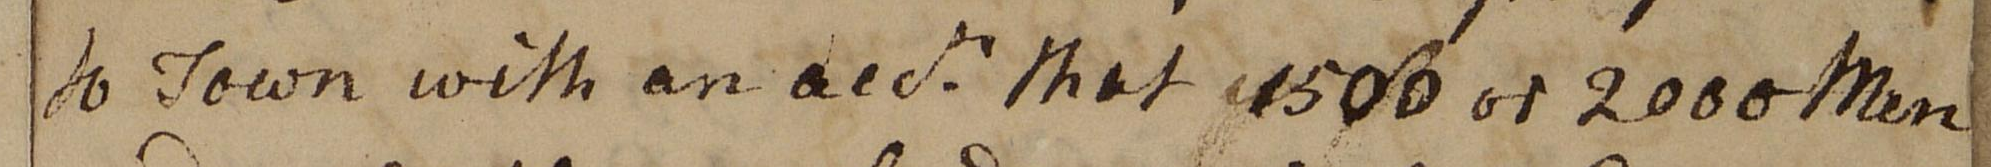to Town with an acc^t. that 1500 or 2000 Men
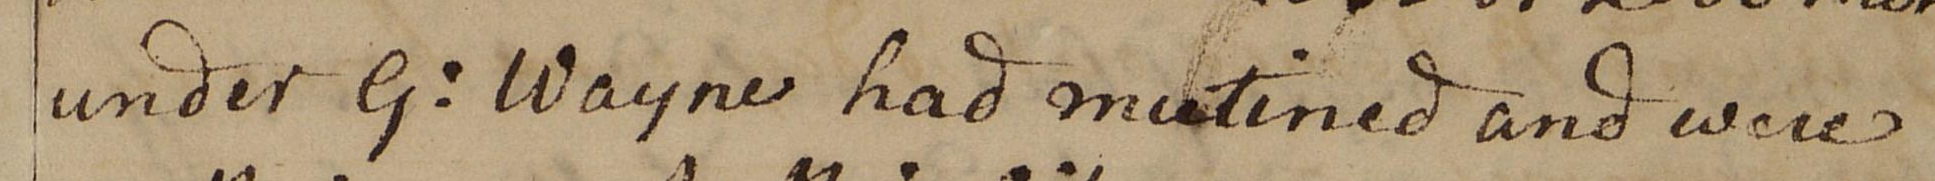under G: Wayne had mutined and were
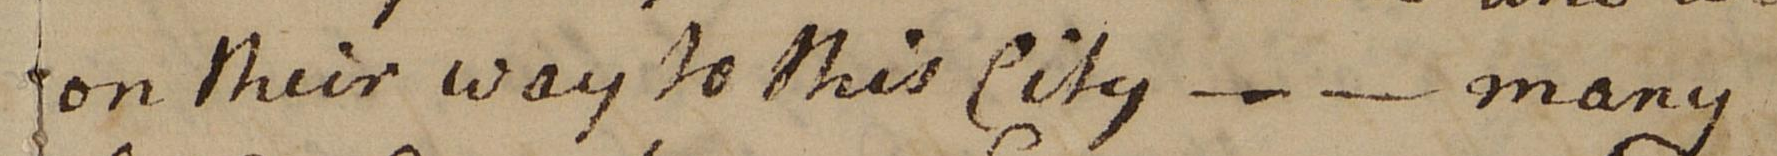on their way to this City--- many
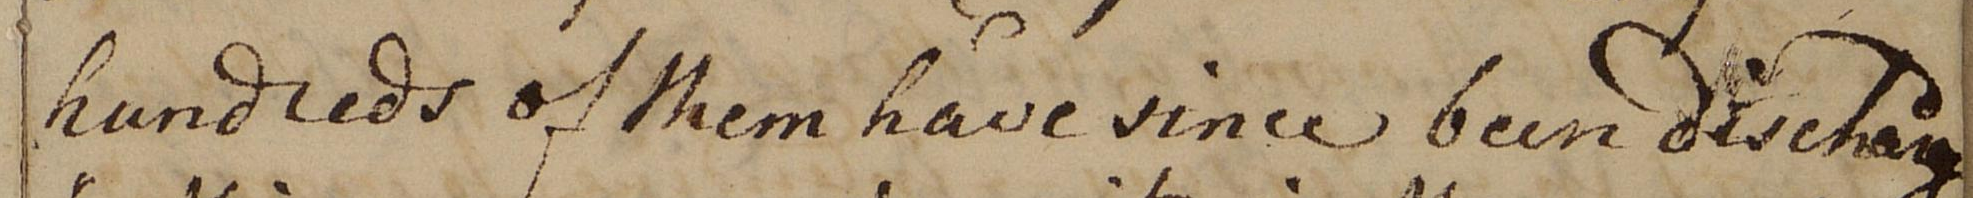hundreds of them have since been discharg^d
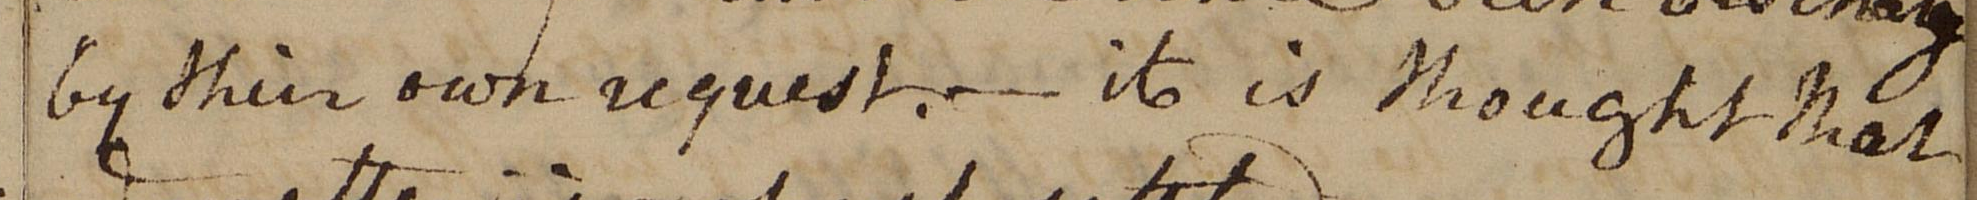by their own request.- it is thought that
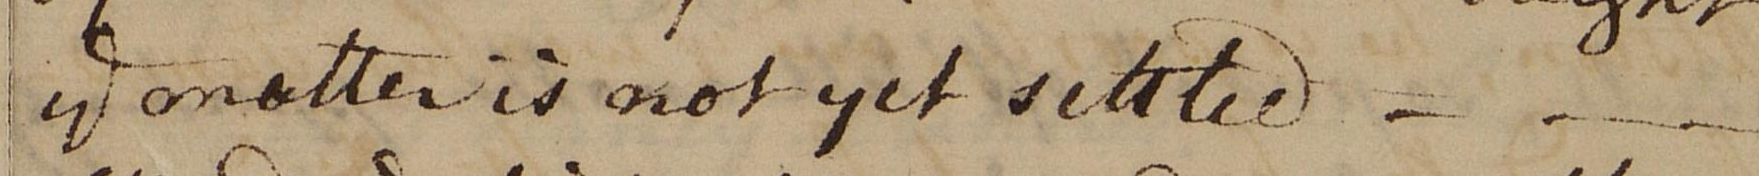y^e matter is not yet settled--
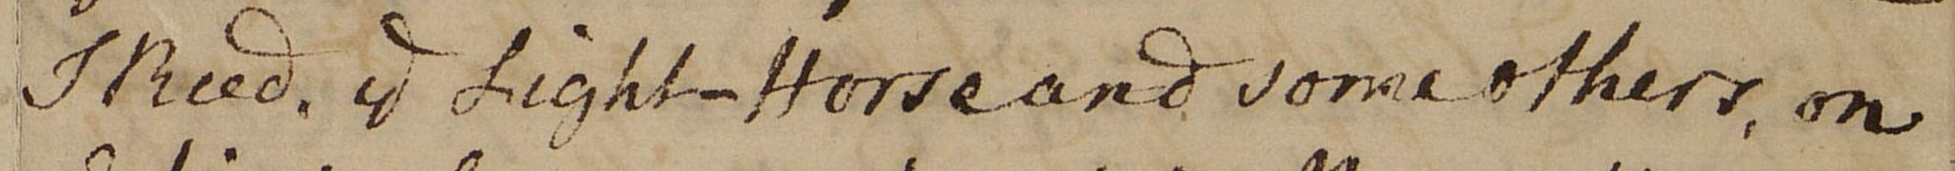J Reed, y^e Light-Horse and some others, on
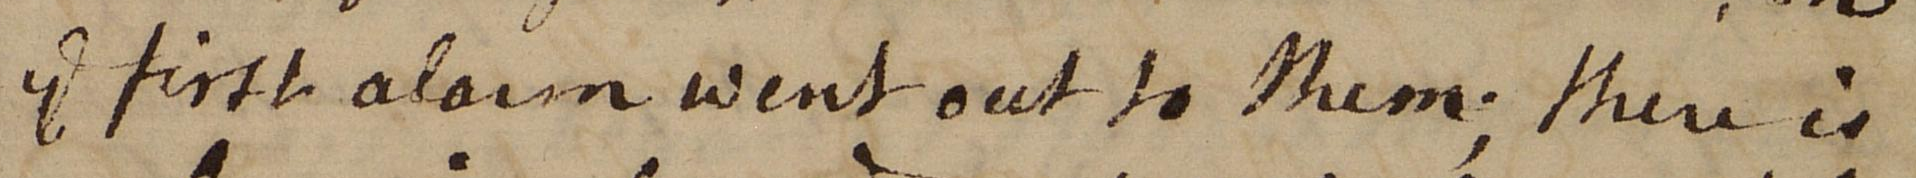y^e first alarm went out to them; there is
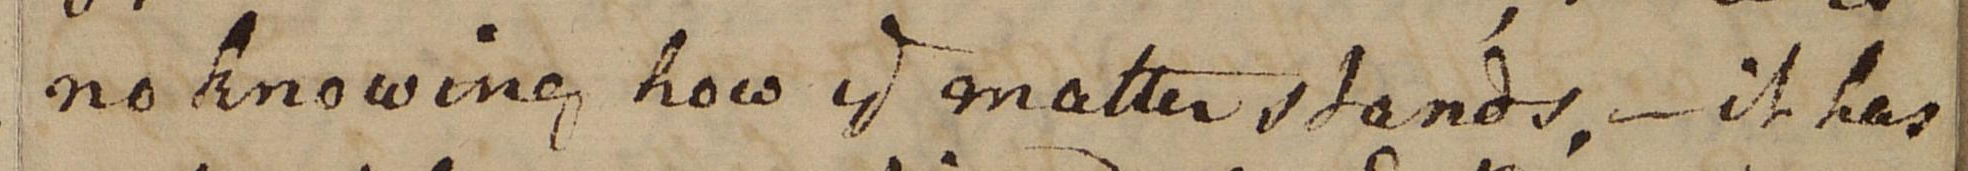no knowing how y^e matter stands,- it has
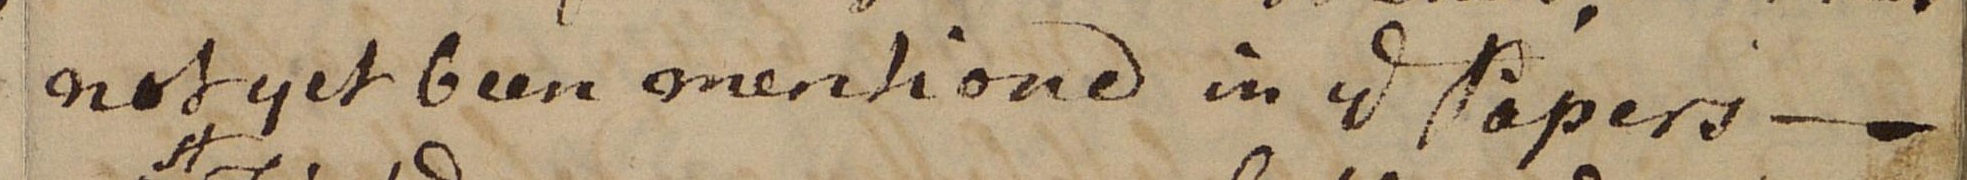not yet been mentiond in y^e Papers-
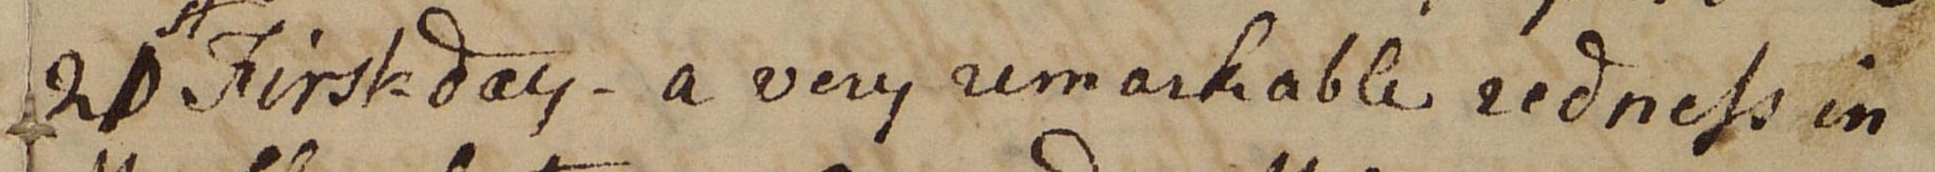21^st First day- a very remarkable redness in
